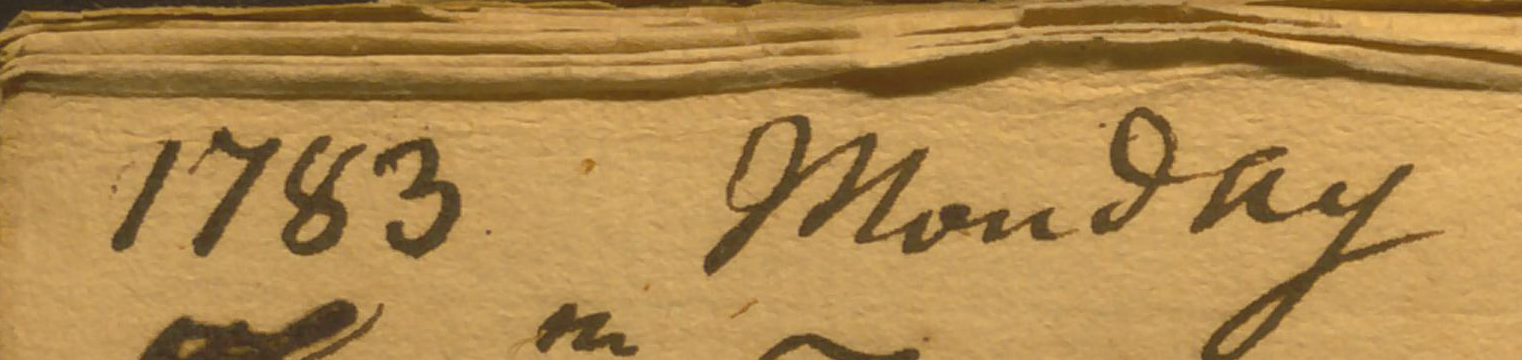1783 Monday
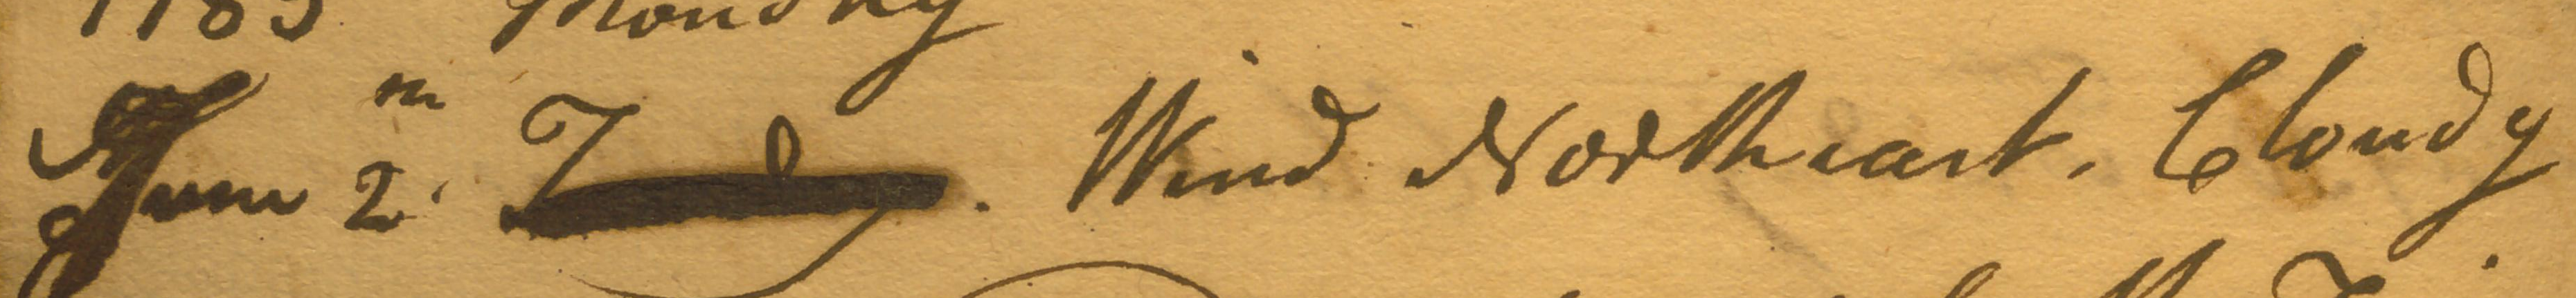June 2^th. Tuesday Wind Northeast. Cloudy
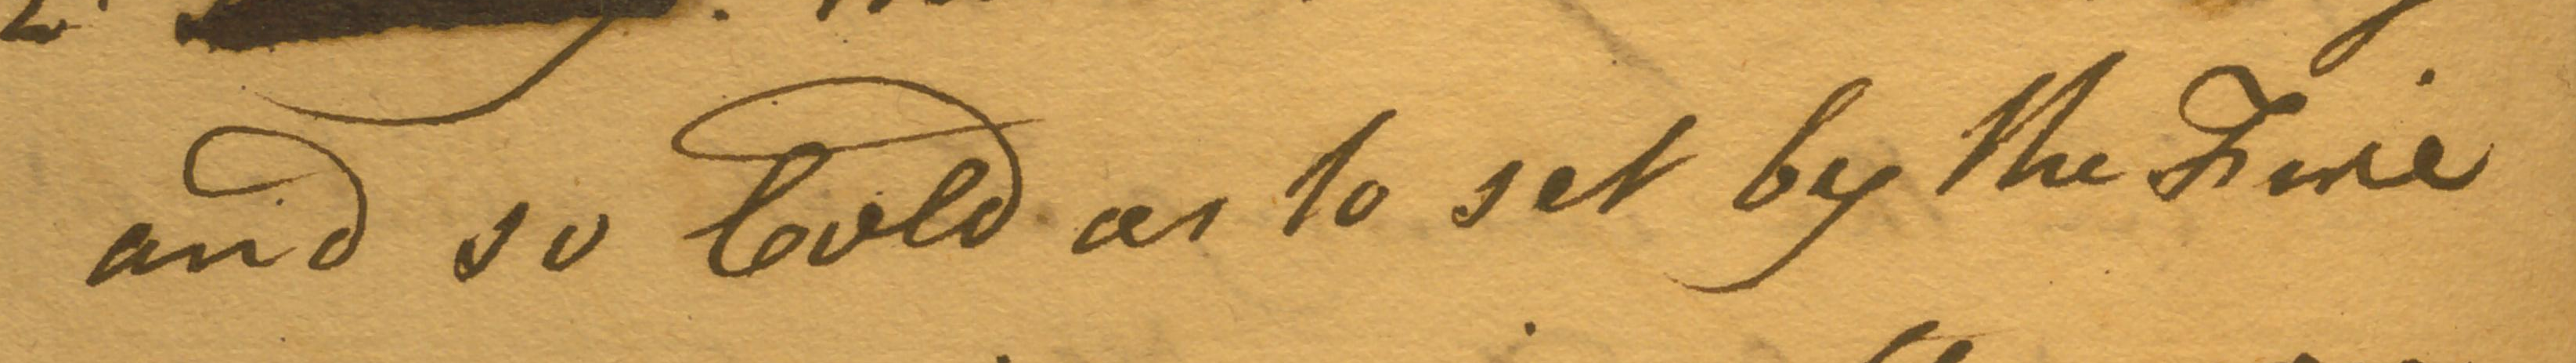and so Cold as to set by the Fire
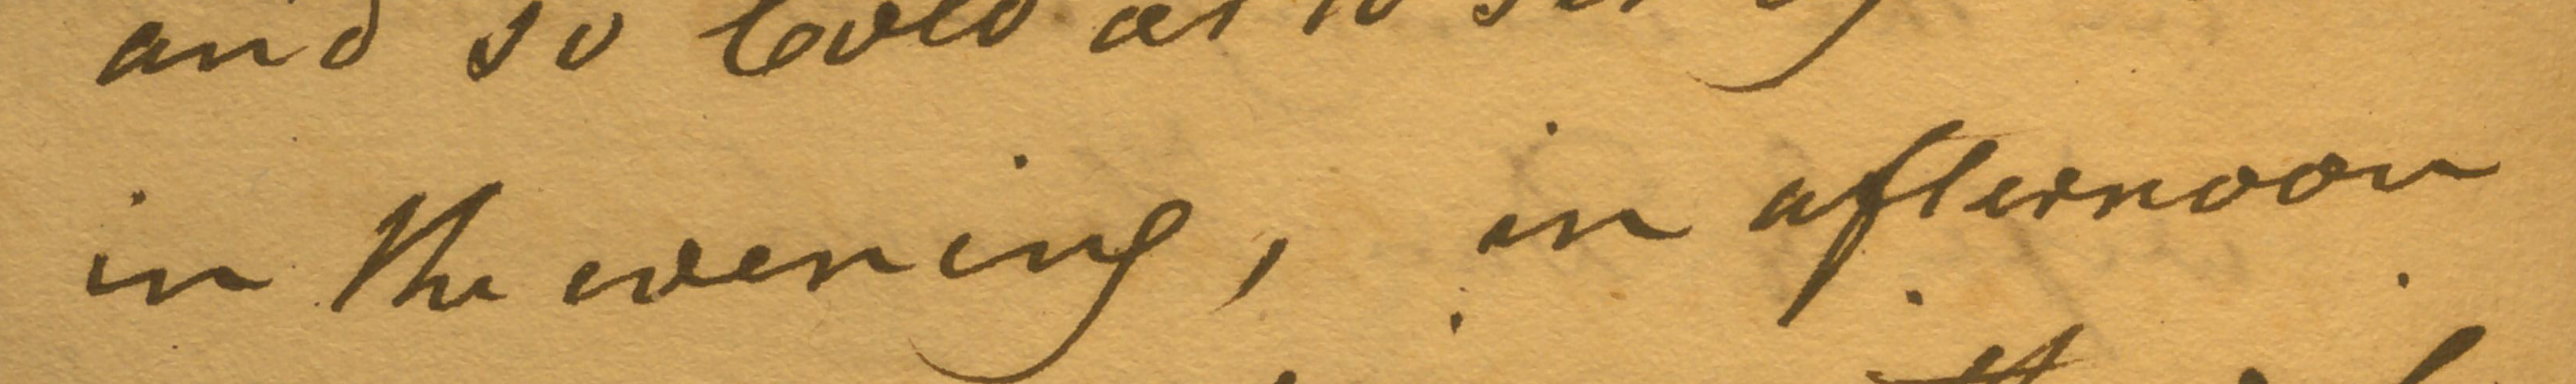in the evening, in afternoon
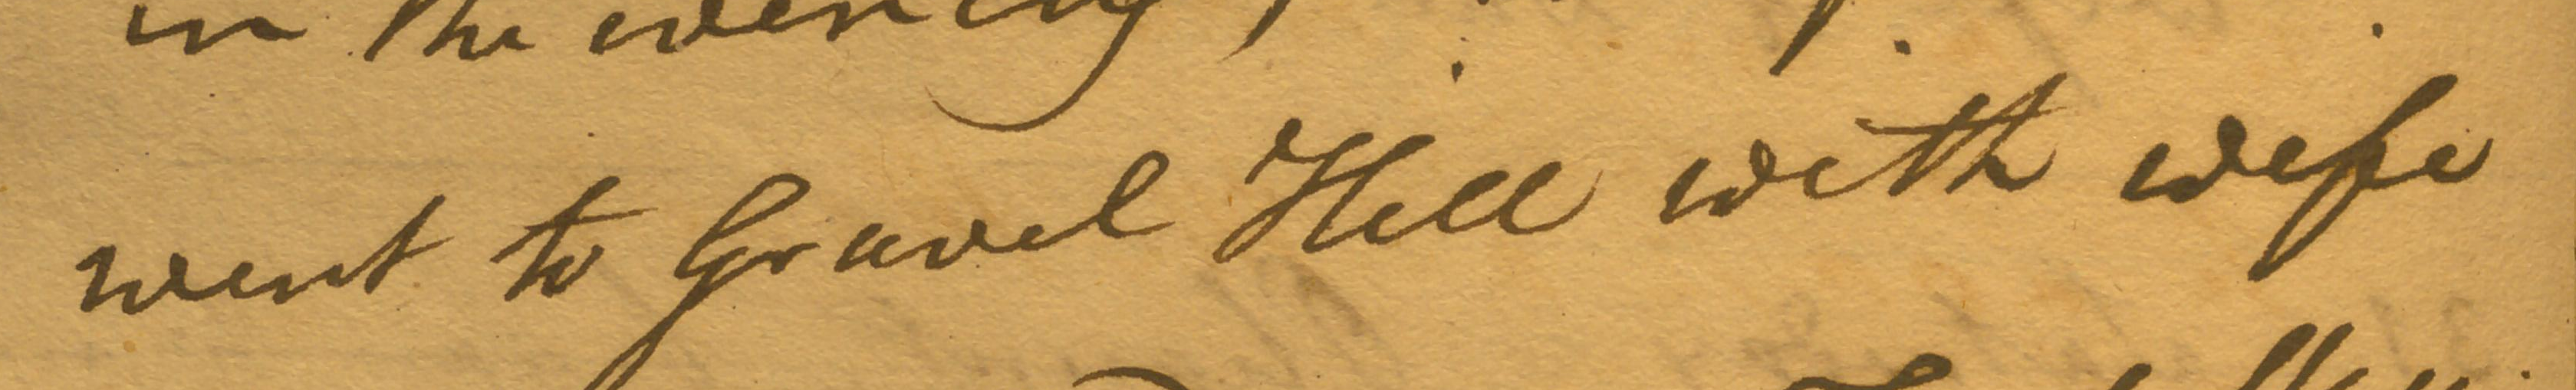went to Gravel Hill with wife
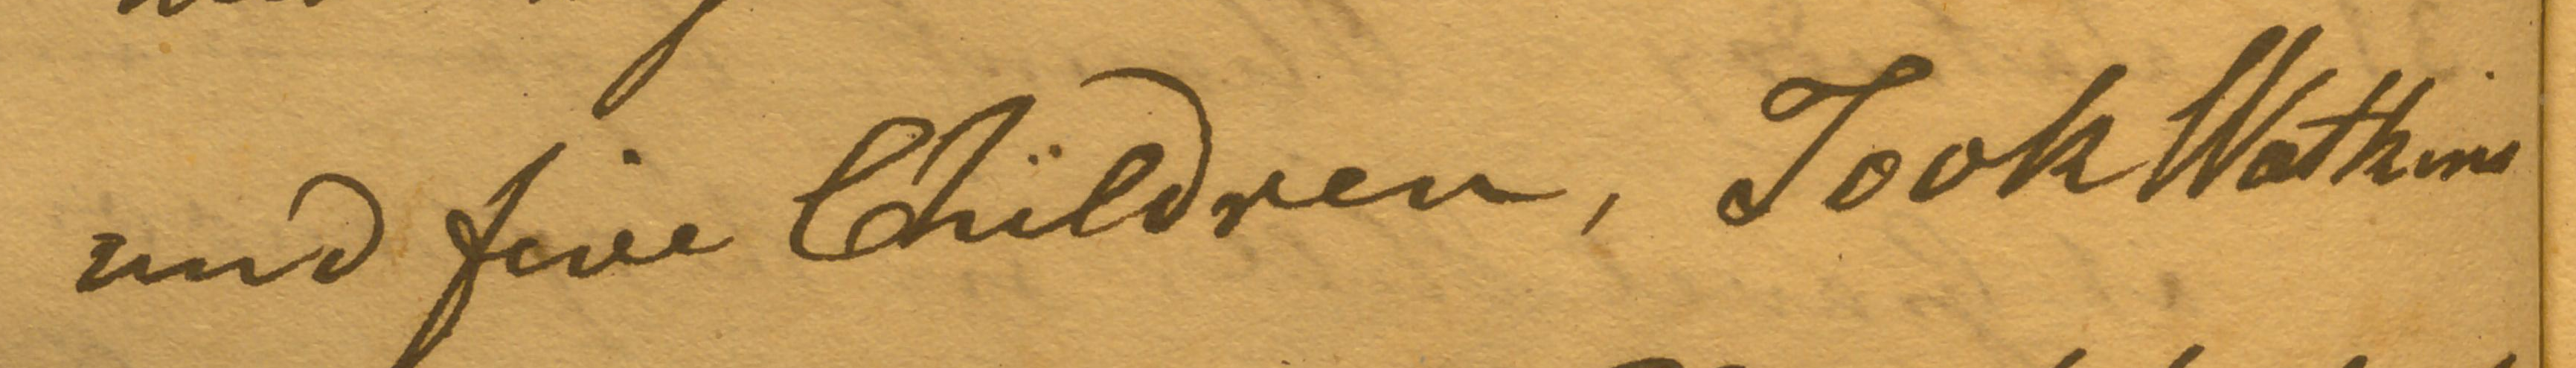and five Children, Took Watkins
